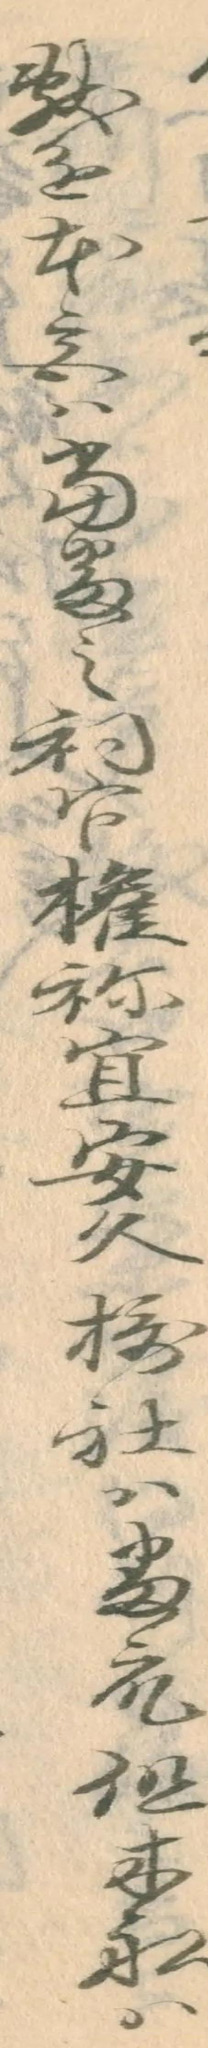献進本宮ハ当番之祠官権祢宜安久摂社ハ番衆但木船ハ
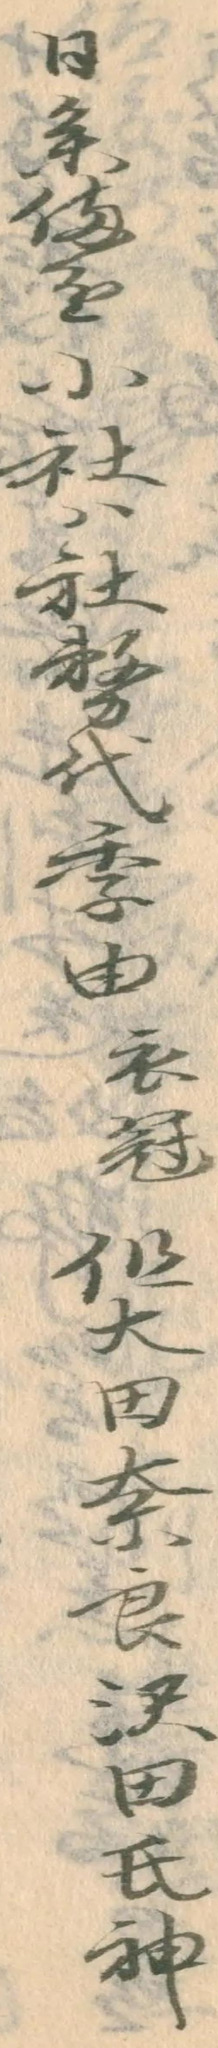日参備進小社ハ社務代季由衣冠但大田奈良沢田氏神
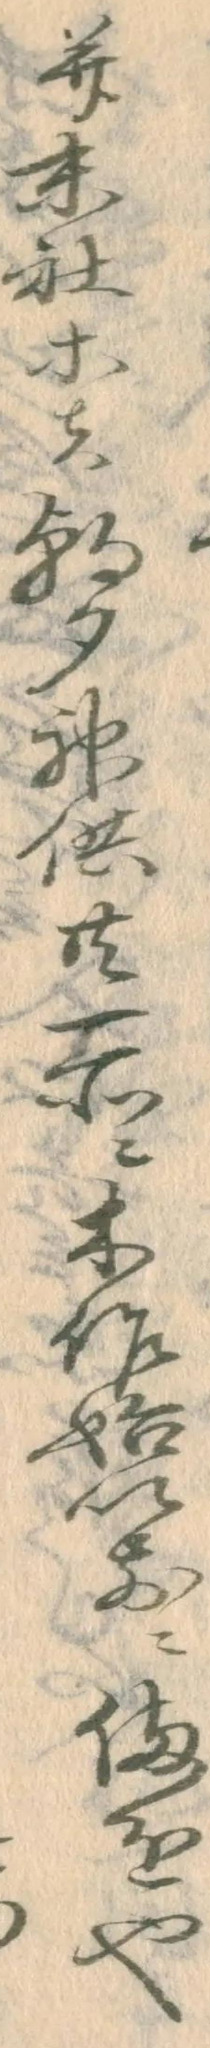并末社等は朝夕神供共一所ニ木作始以前ニ備進也
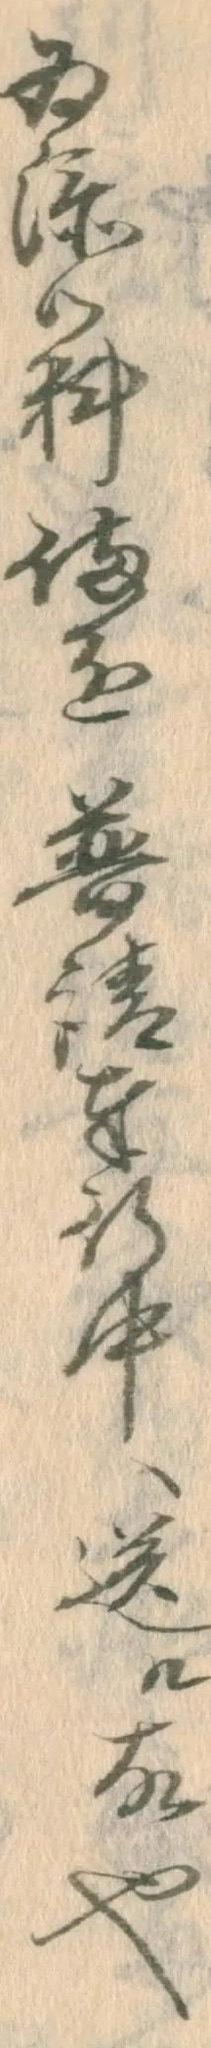為添御料備進普請奉行中へ送ル故也
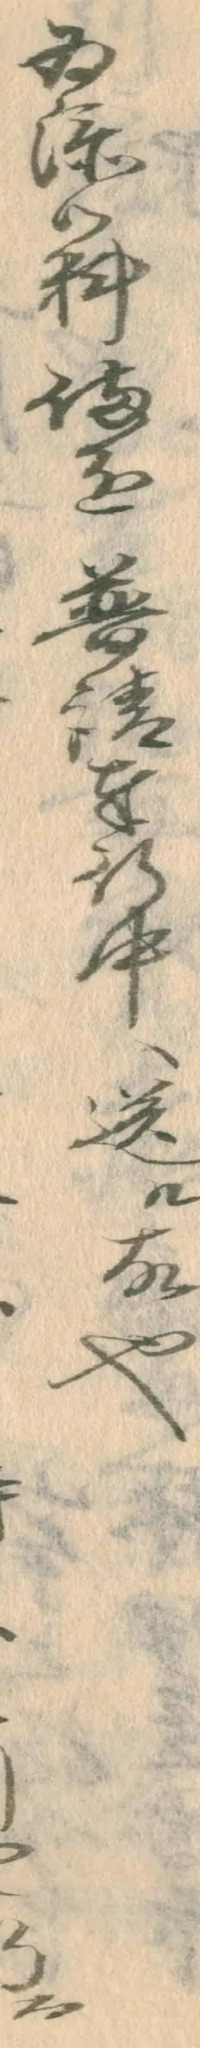為添御料備進普請奉行中へ送ル故也
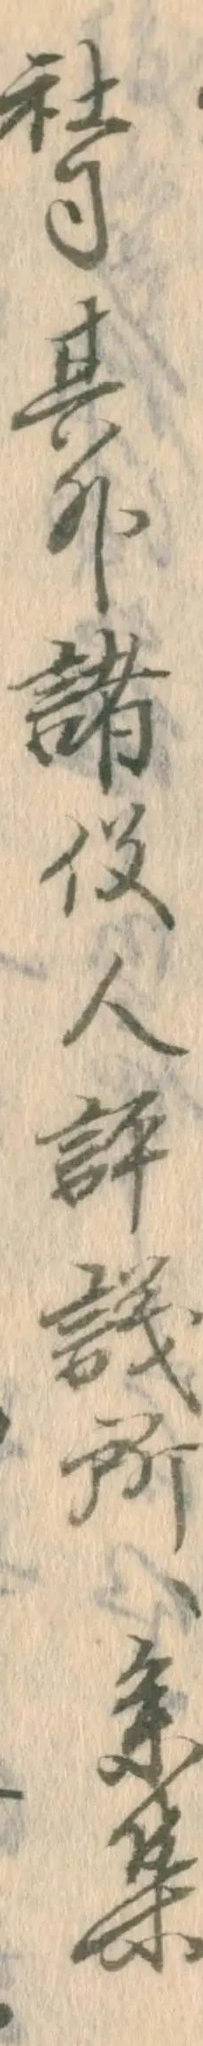社司其外諸役人評議所へ参集
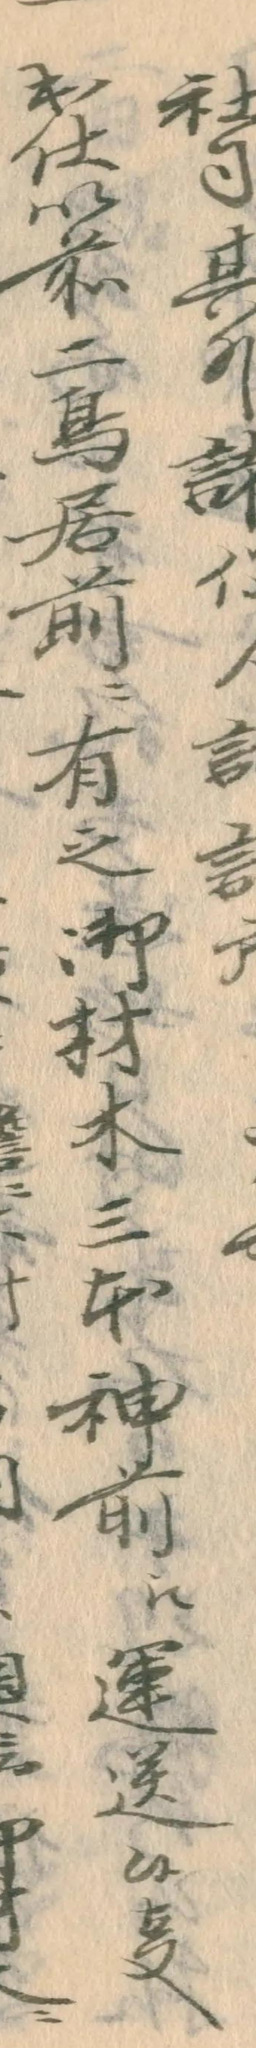一出仕以前二鳥居前ニ有之御材木三本神前江運送候事
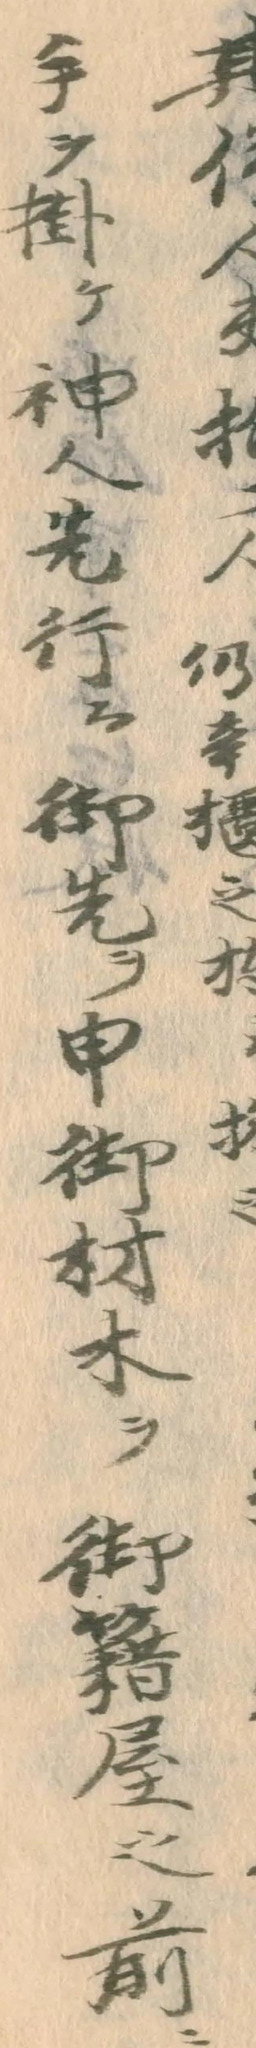手ヲ掛ケ神人先行而御先ヲ申御材木ヲ御藉屋之前ニ
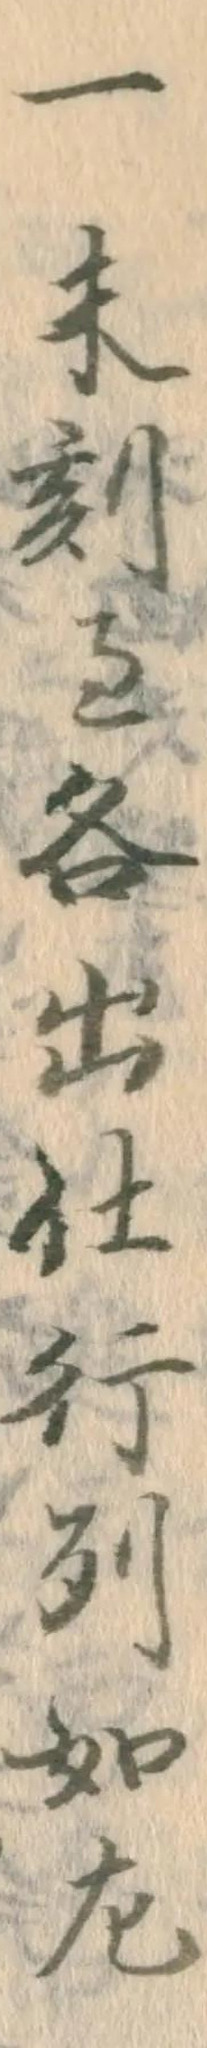一未刻過各出仕行列如左
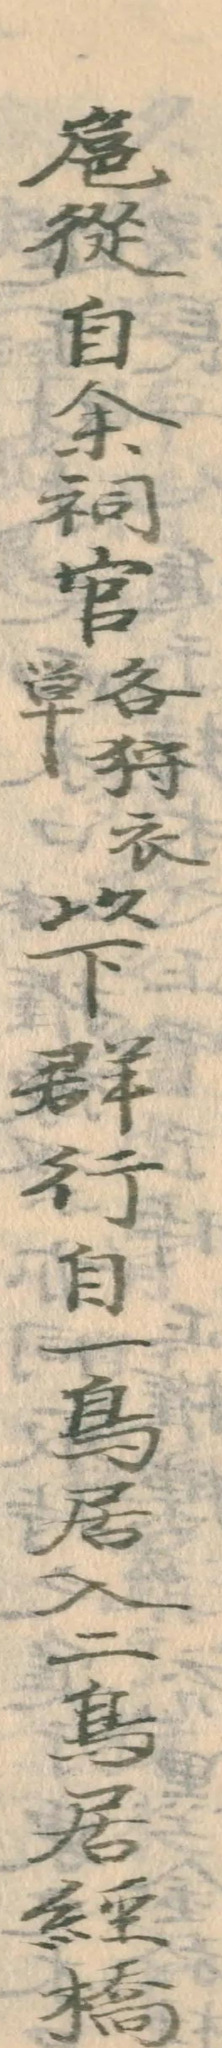扈従自余祠官各狩衣単以下群行自一鳥居入二鳥居経橋
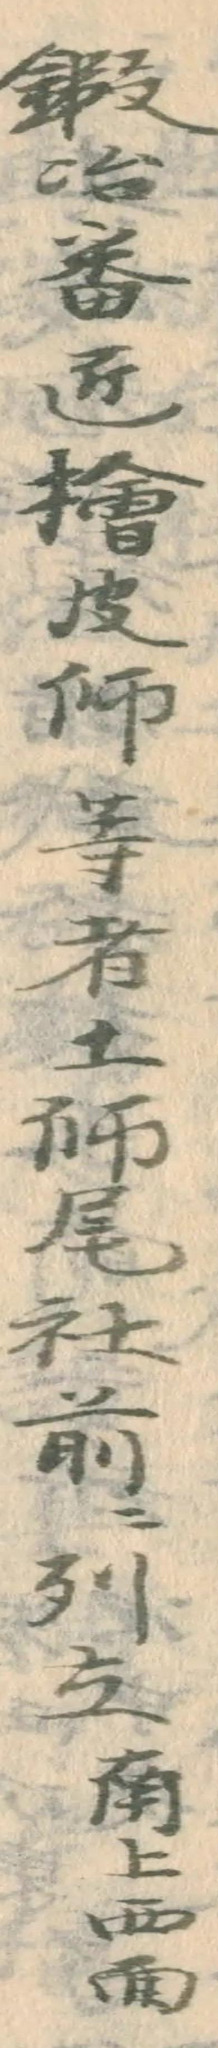鍛冶番匠檜皮師等は土師尾社前ニ列立南上西面
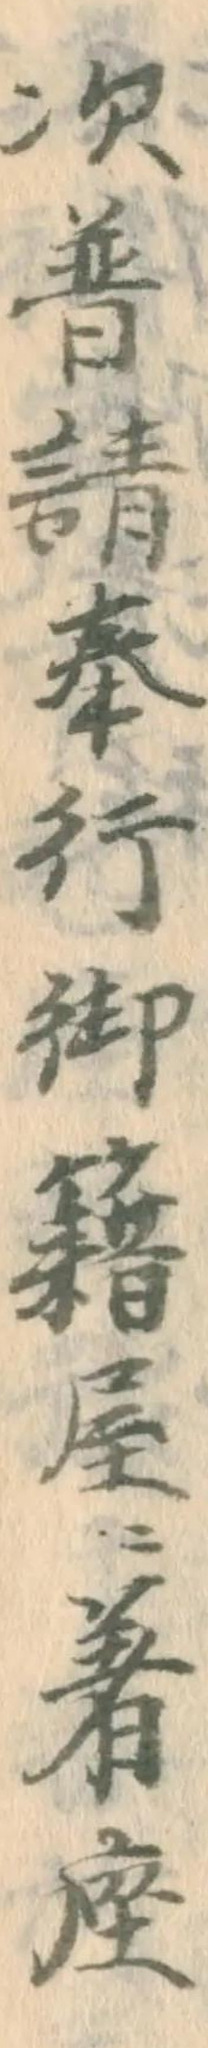次普請奉行御籍屋ニ着座

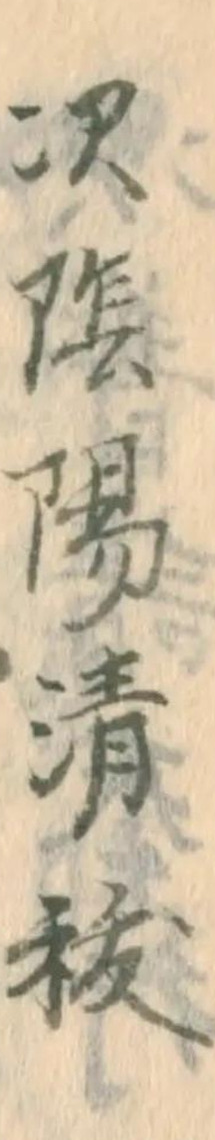次陰陽清祓
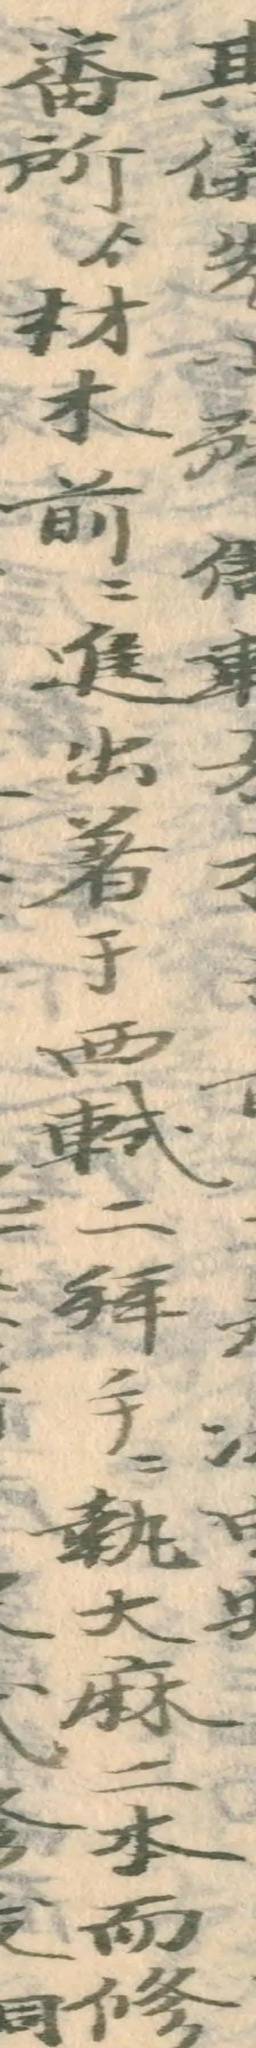番所ゟ材木前ニ進出着于西軾二拝手ニ執大麻二本而修
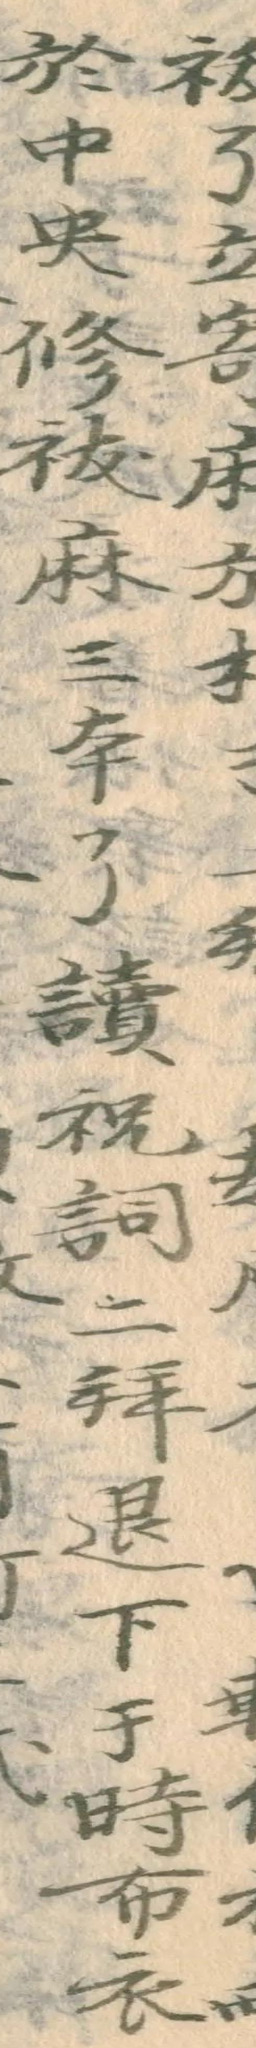於中央修祓麻三本了読祝詞二拝退下于時布衣
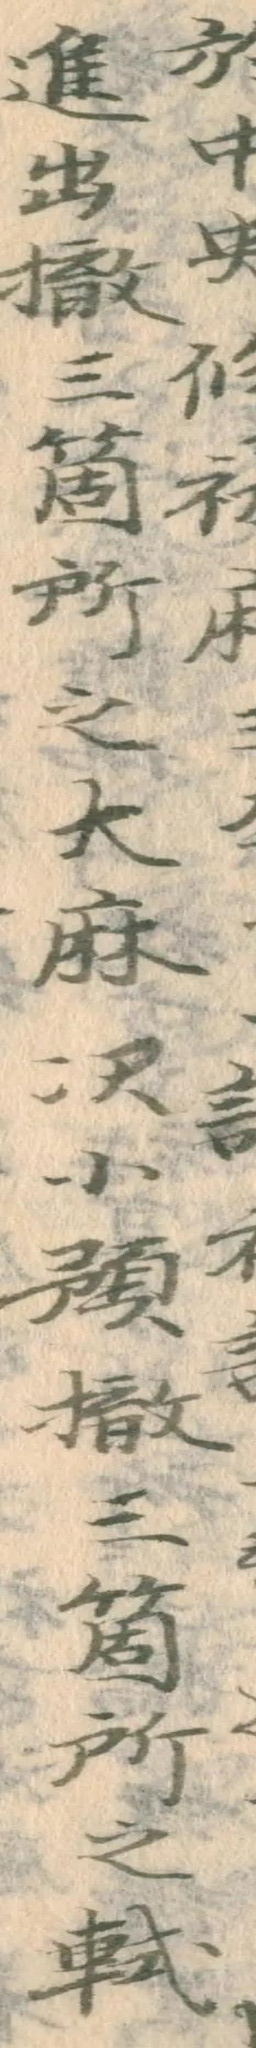進出撤三箇所之大麻次小預撤三箇所之軾
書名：賀茂社記録. 第17冊
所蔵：国立国会図書館 National Diet Library, JAPAN
